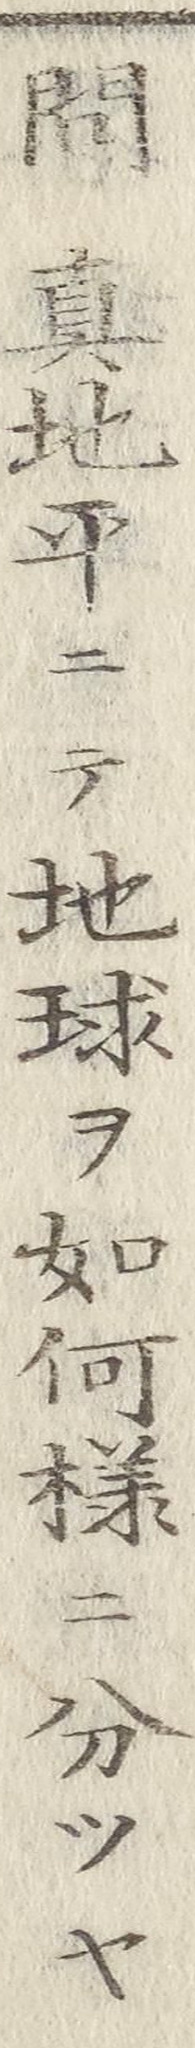問真地平ニテ地球ヲ如何様ニ分ツヤ
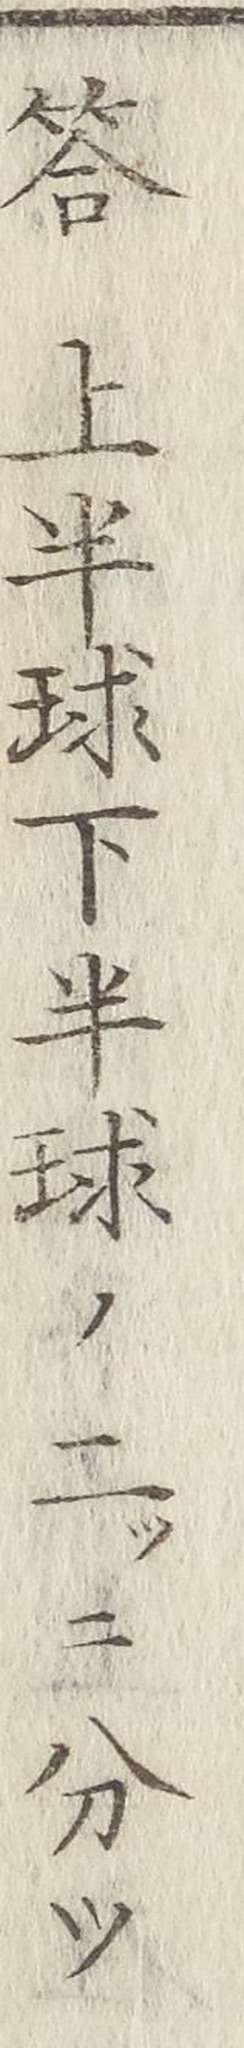答上半球下半球ノ二ツニ分ツ

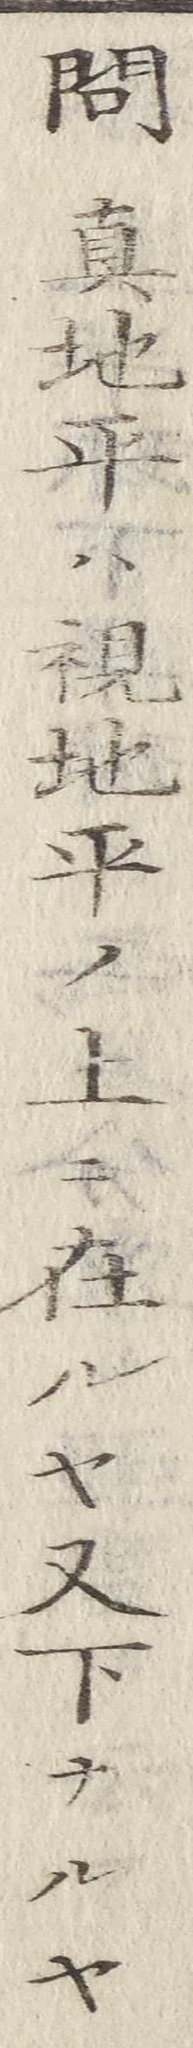問真地平ハ視地平ノ上ニ在ルヤ又下ナルヤ
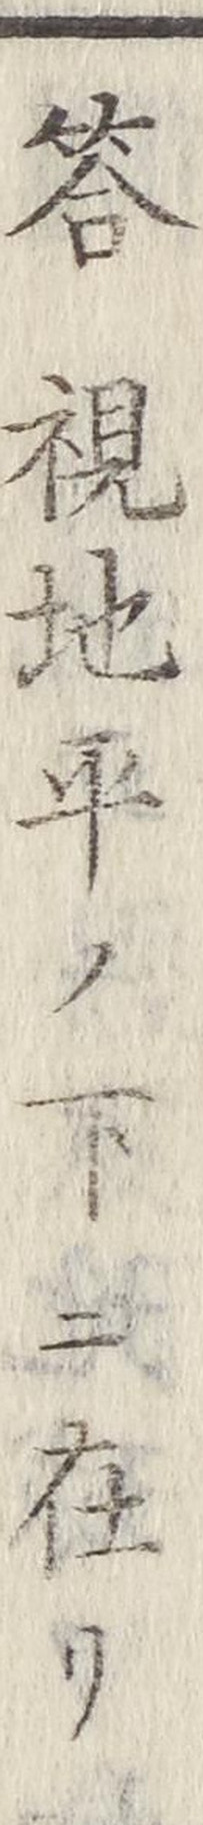答視地平ノ下ニ在リ
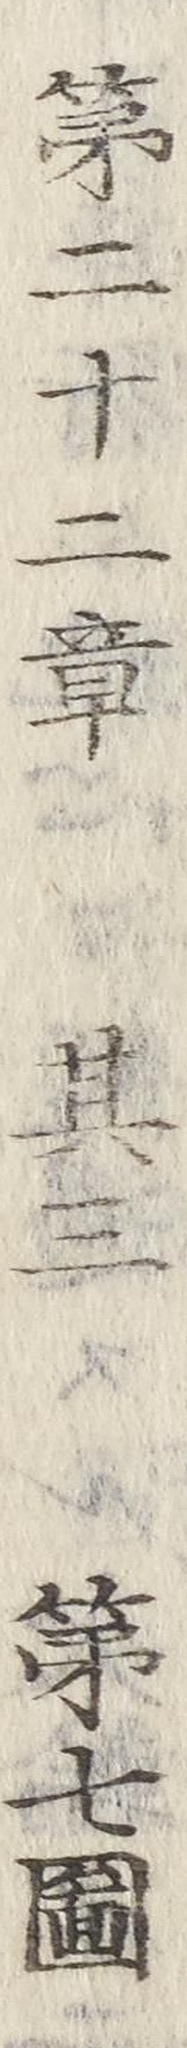第二十二章其三第七図
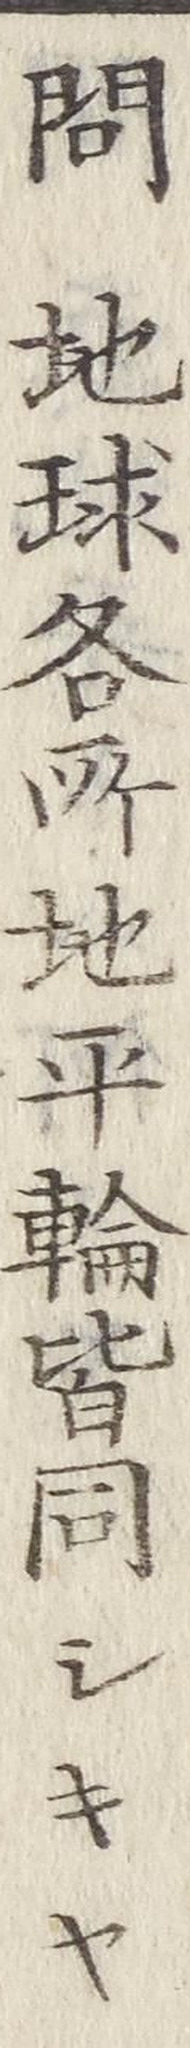問地球各所地平輪皆同シキヤ
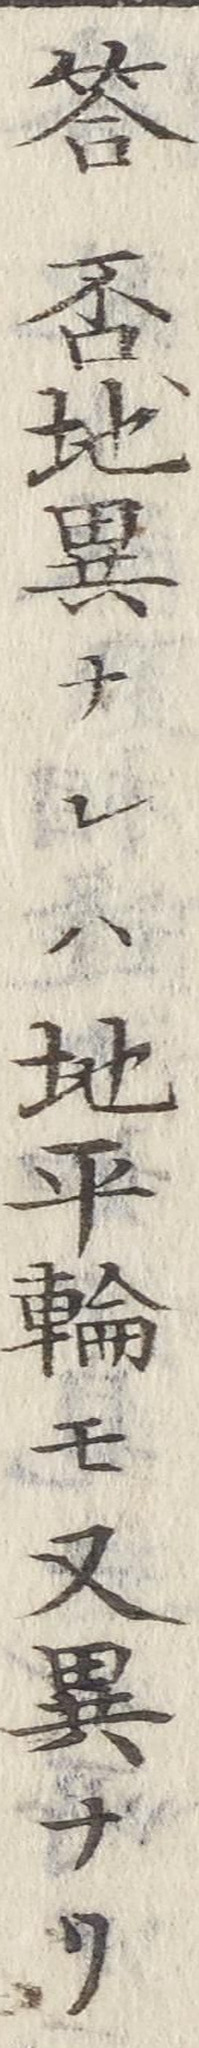答否、地異ナレハ地平輪モ又異ナリ
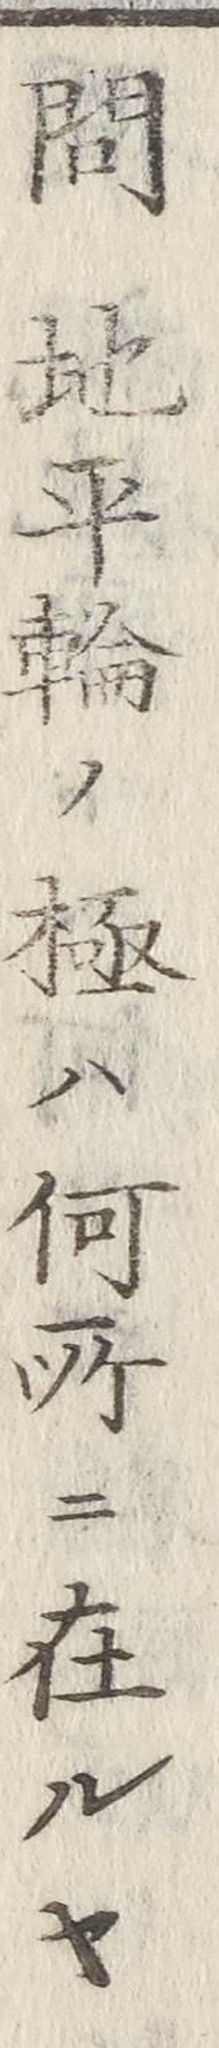問地平輪ノ極ハ何所ニ在ルヤ
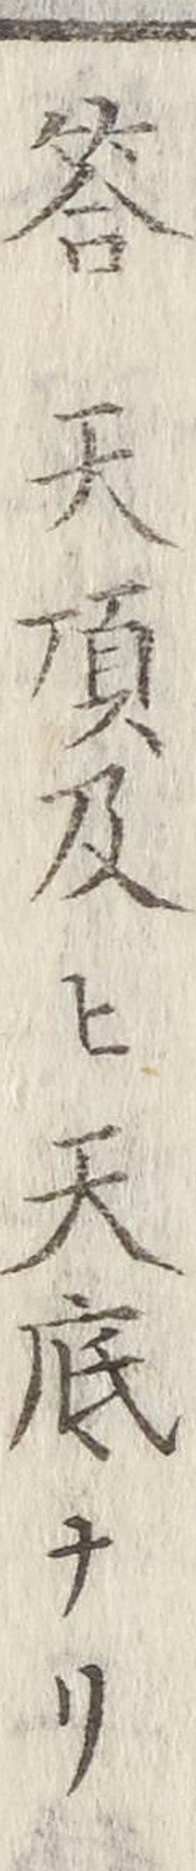答天頂及ヒ天底ナリ
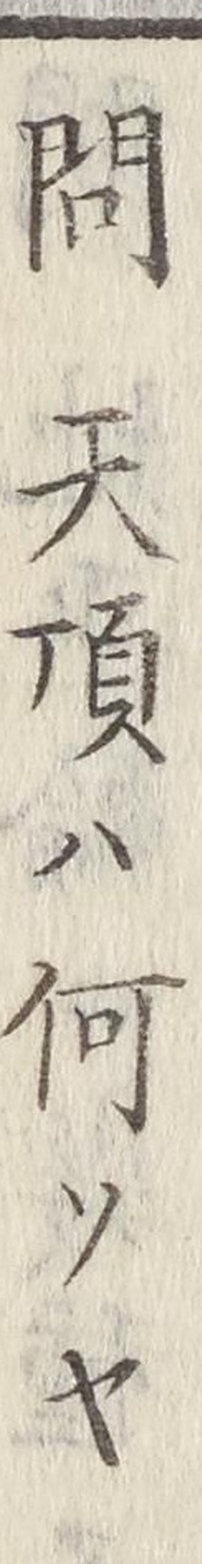問天頂ハ何ソヤ
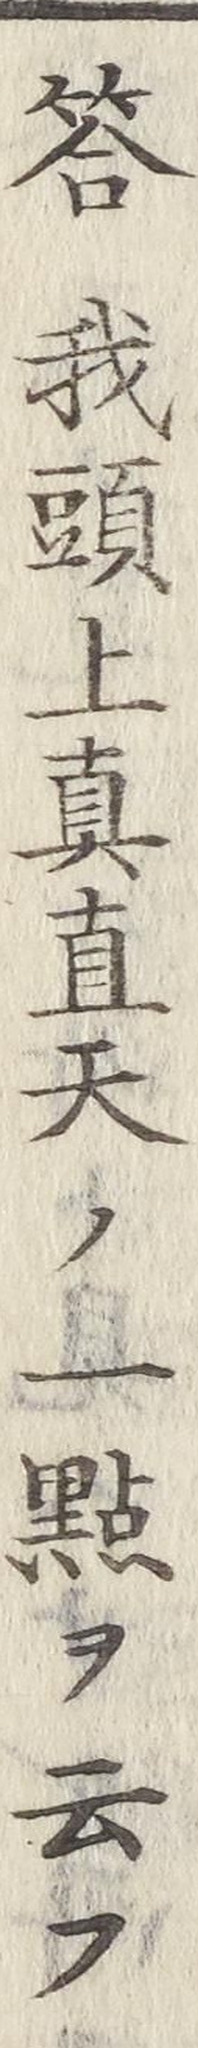答我頭上真直天ノ一点ヲ云フ
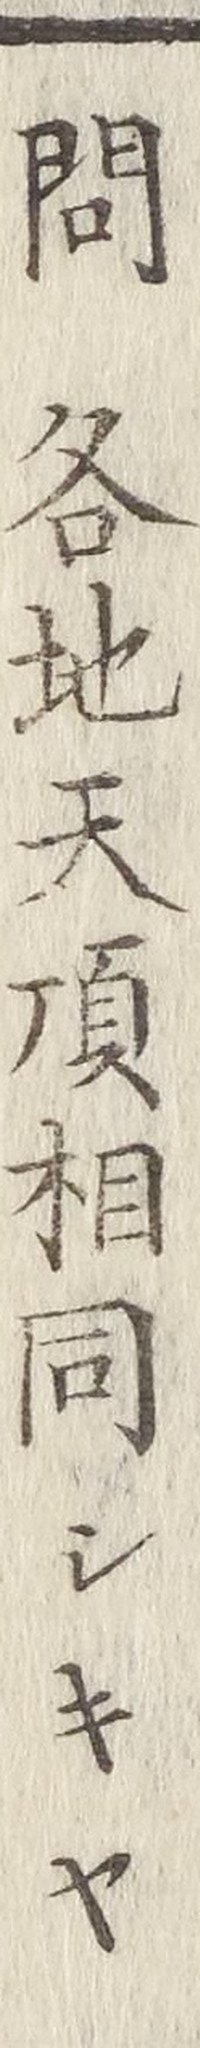問各地天頂相同シキヤ
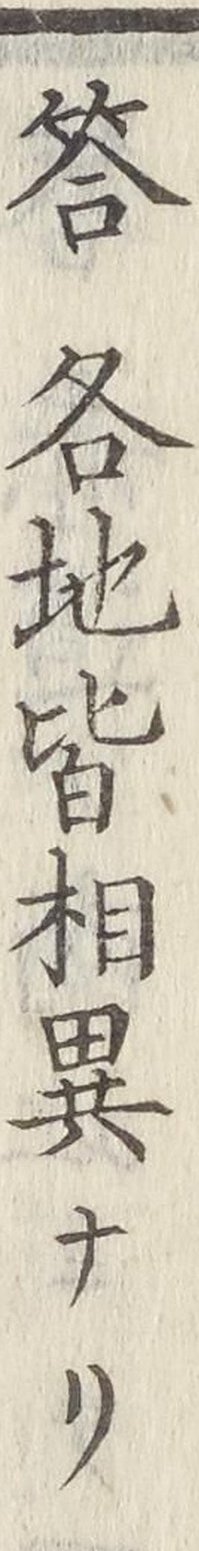答各地皆相異ナリ
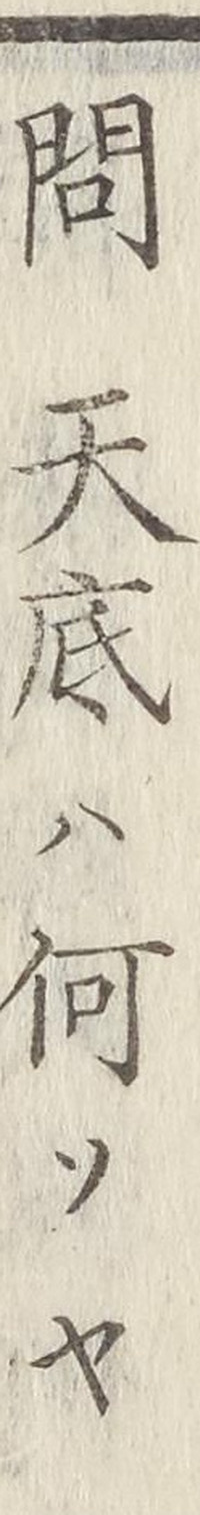問天底ハ何ソヤ
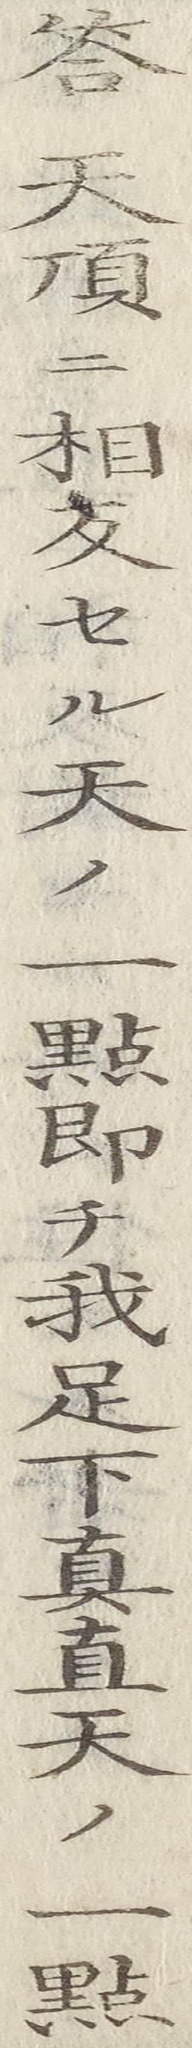答天頂ニ相反セル天ノ一点即チ我足下真直天ノ一点
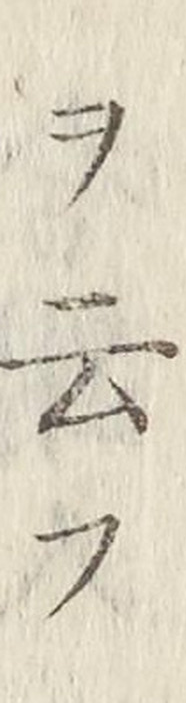ヲ云フ
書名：星学圖説　上
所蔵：東京大学地震研究所図書室 Earthquake Research Institute Library, The University of Tokyo, JAPAN
